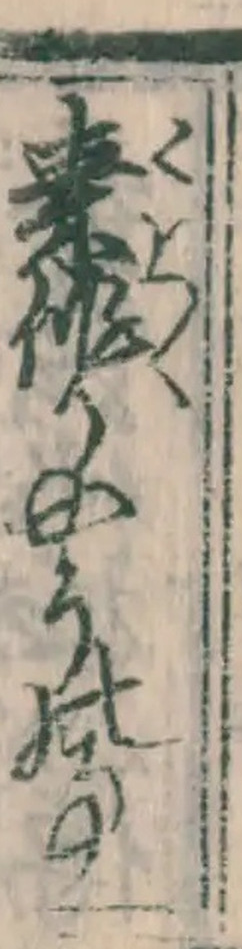桑作りやうの事
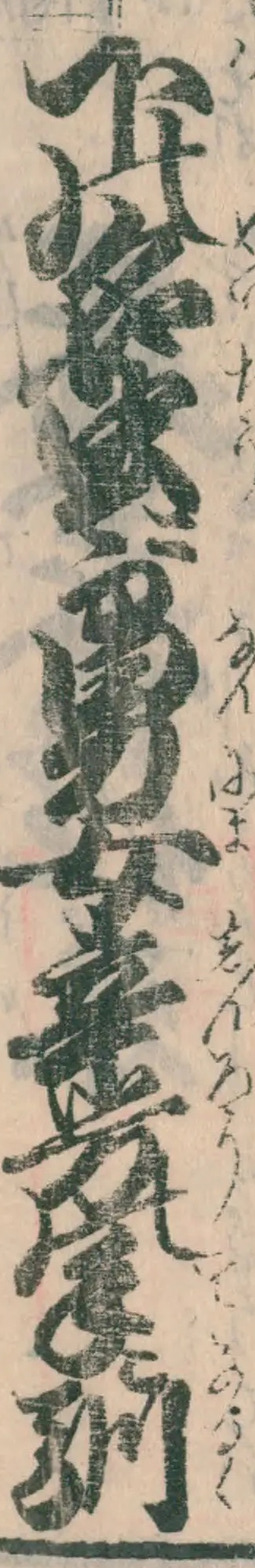下の名虫にて男女辛労の手に馴
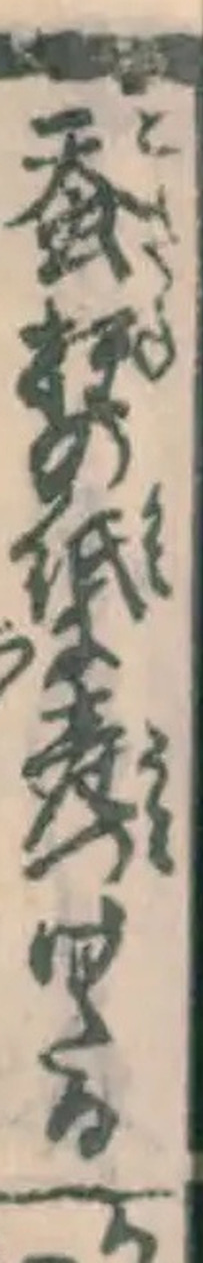蚕種の紙に産つけたる
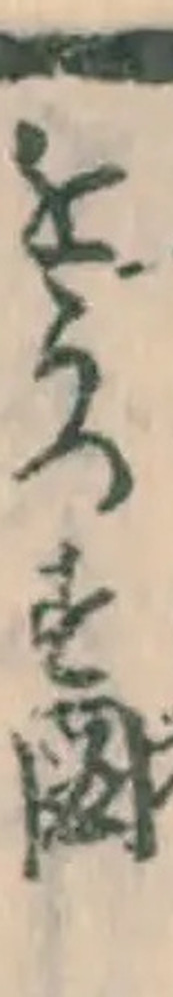をうつす図
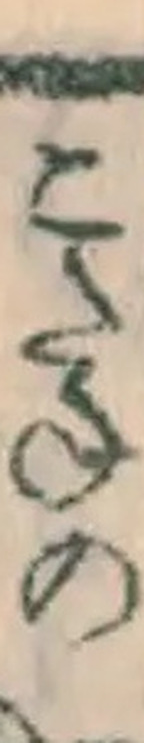こたねの
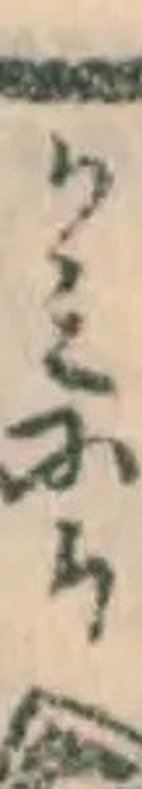かみにう
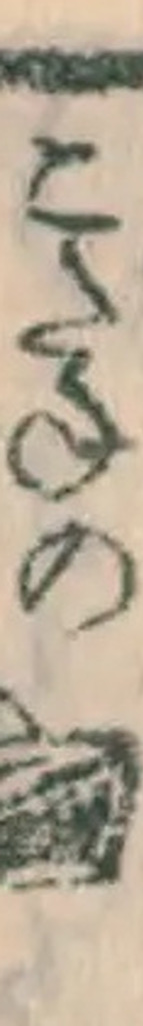こたねの
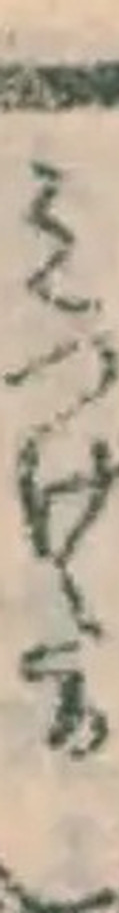えつけたる
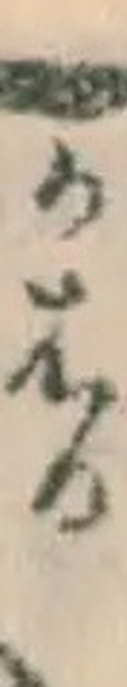がはる
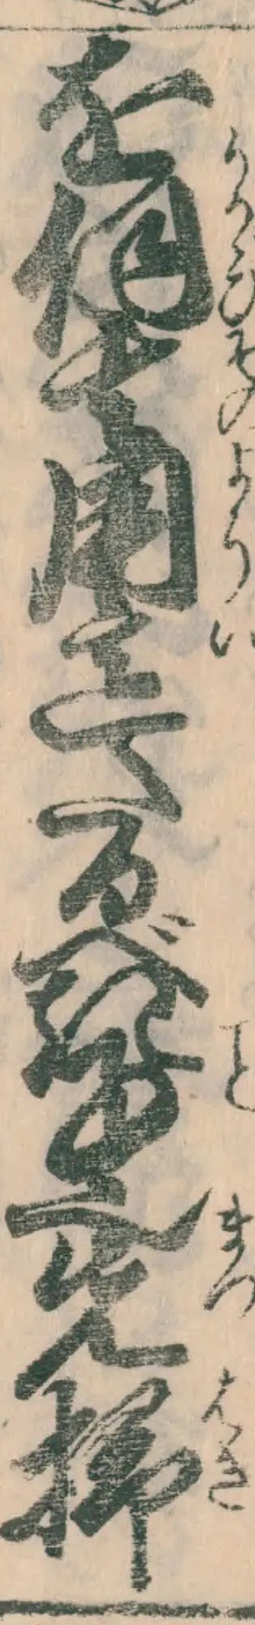を伺其用意たるべき事也先掃
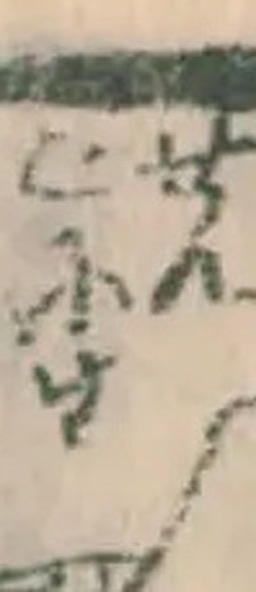ごに生
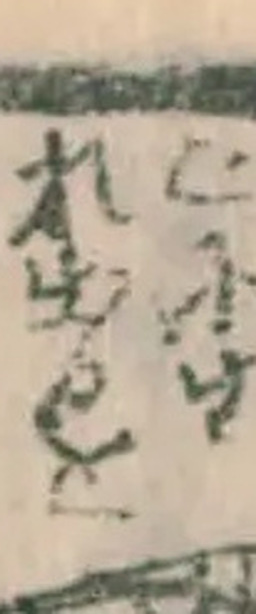れ出るを
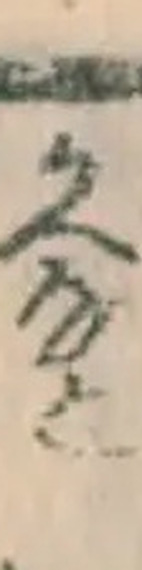かへると
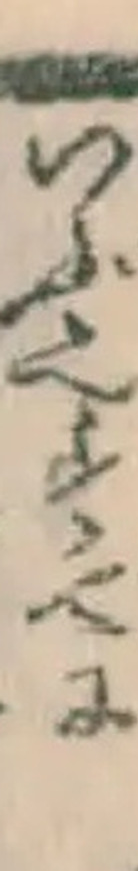いふ也すでに
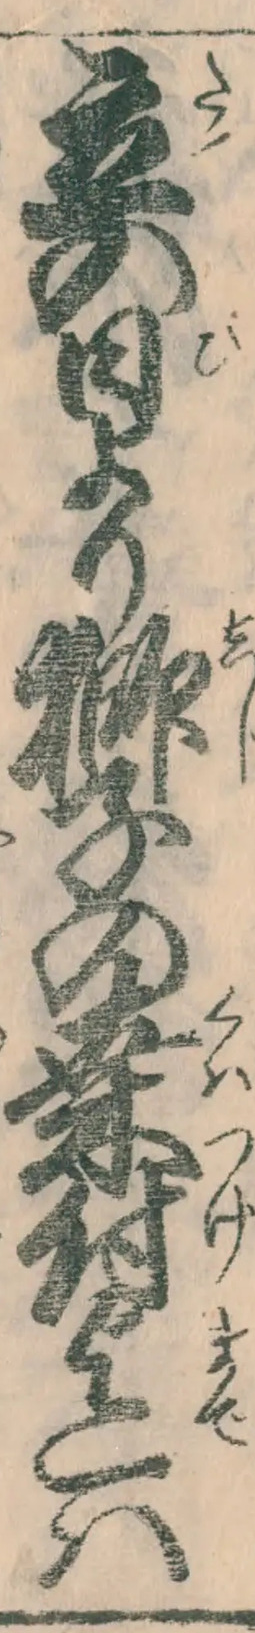立の日より獅子の桑付迄は
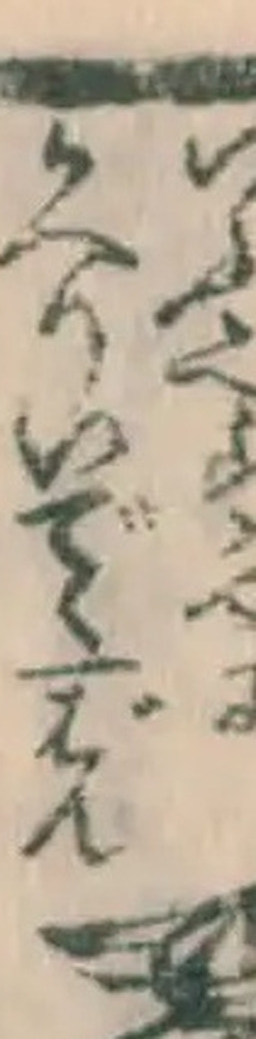かへりいでゝ一ばん
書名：養蚕往来
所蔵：国立国会図書館 National Diet Library, JAPAN
